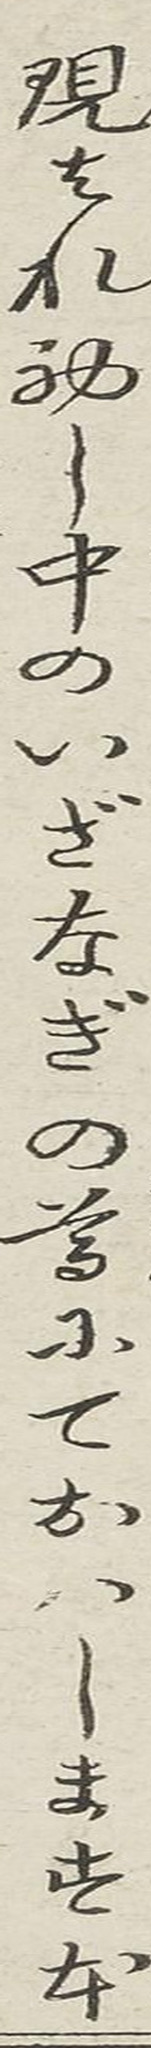現われ初し中のいざなぎの尊にておはします本
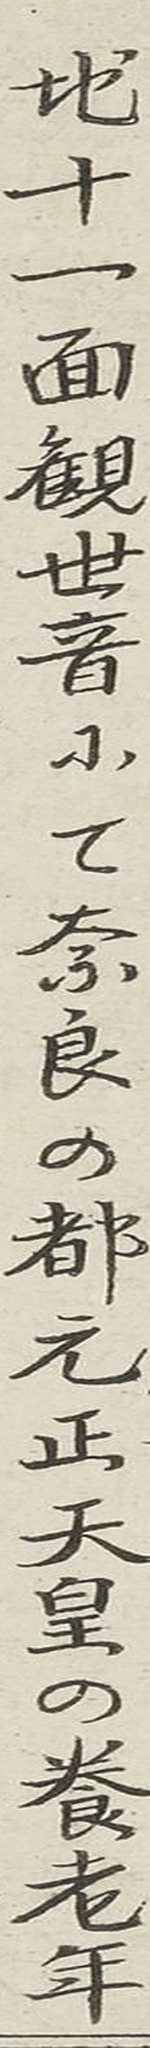地十一面観世音にて奈良の都元正天皇の養老年
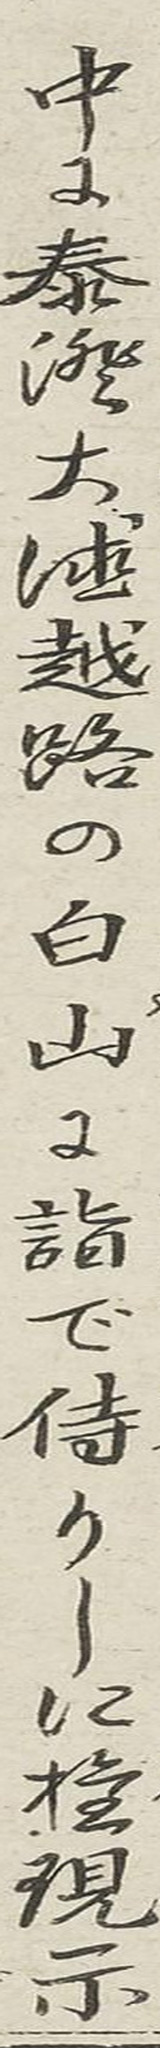中に泰澄大徳越路の白山に詣で侍りしに権現示
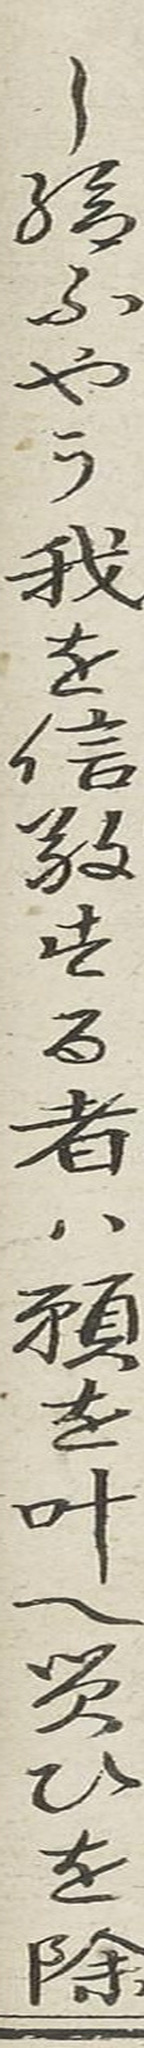し給ふやう我を信敬する者は願を叶へ災ひを除
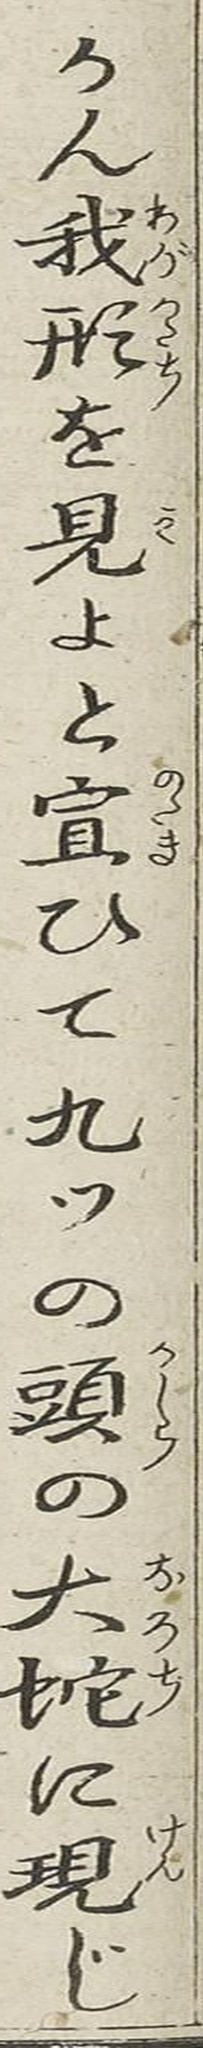かん我形を見よと宣ひて九ッの頭の大蛇に現じ
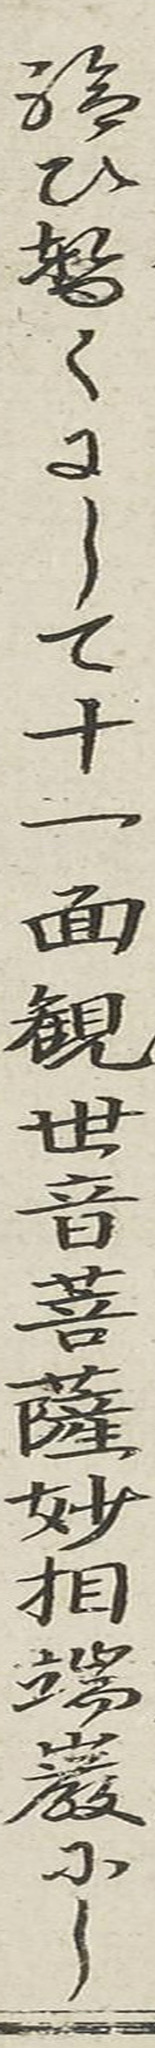給ひ暫くにして十一面観世音菩薩妙相端巌にし
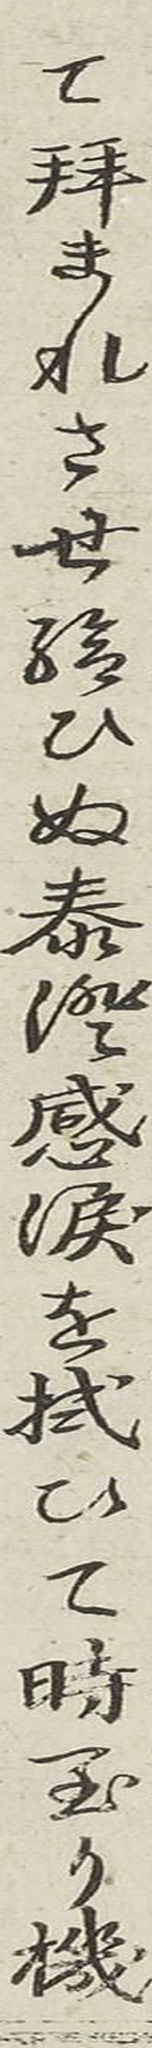て拝まれさせ給ひぬ泰澄感涙を拭ひて時至り機
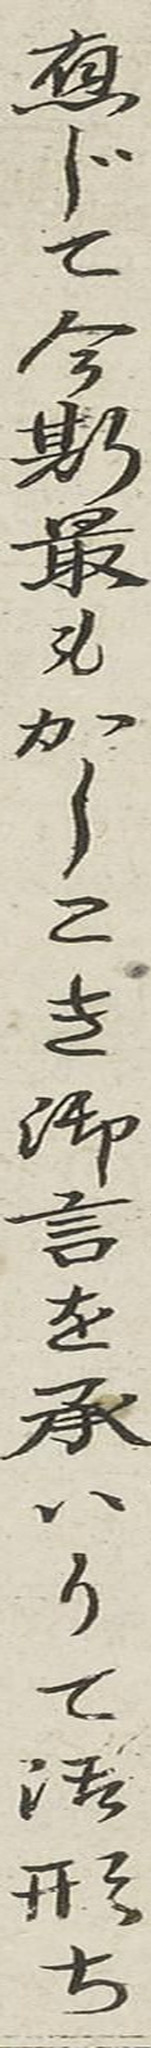応じて今斯最もかしこき御言を承はりて御形ち
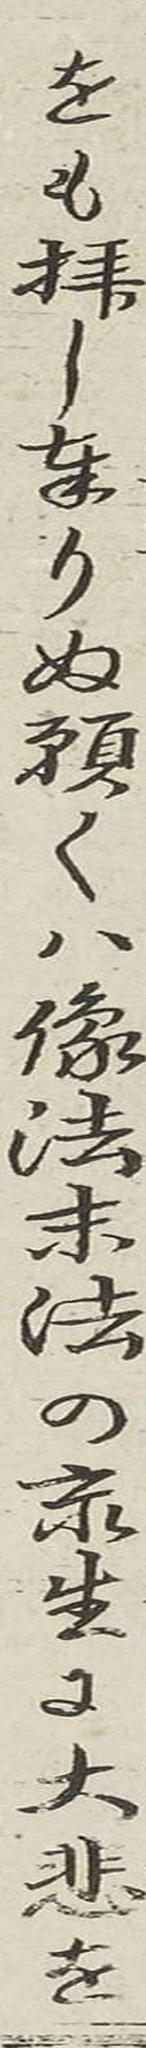をも拝し奉りぬ願くは像法末法の衆生に大悲を
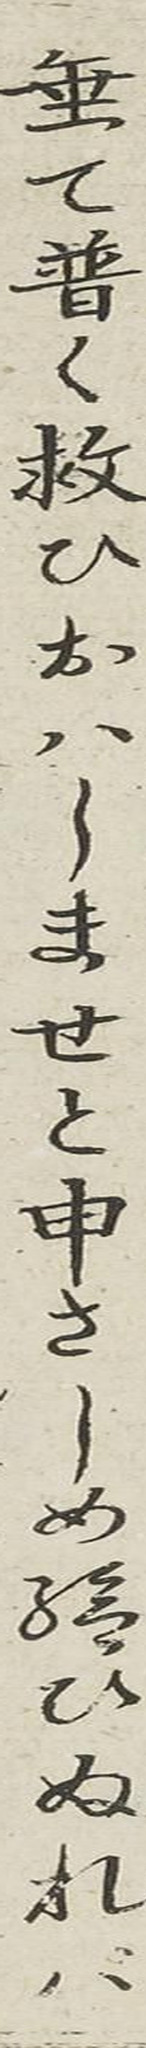垂て普く救ひおはしませと申さしめ給ひぬれば
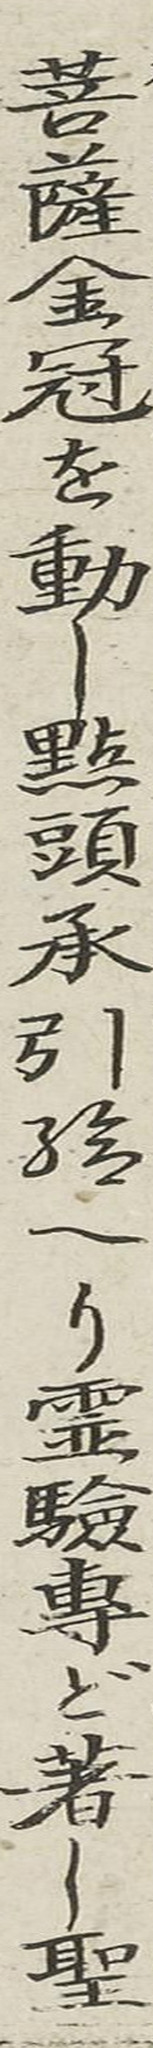菩薩金冠を動し點頭承引給へり霊験専ど著し聖
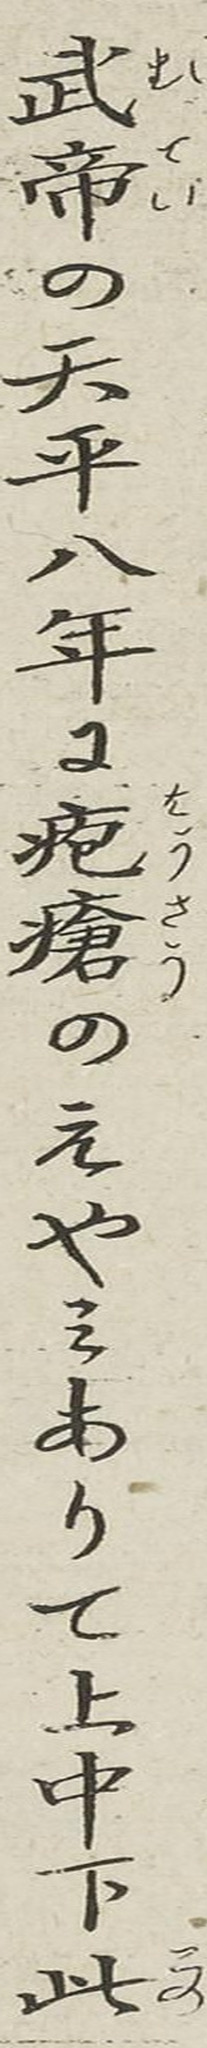武帝の天平八年に疱瘡のえやみありて上中下此
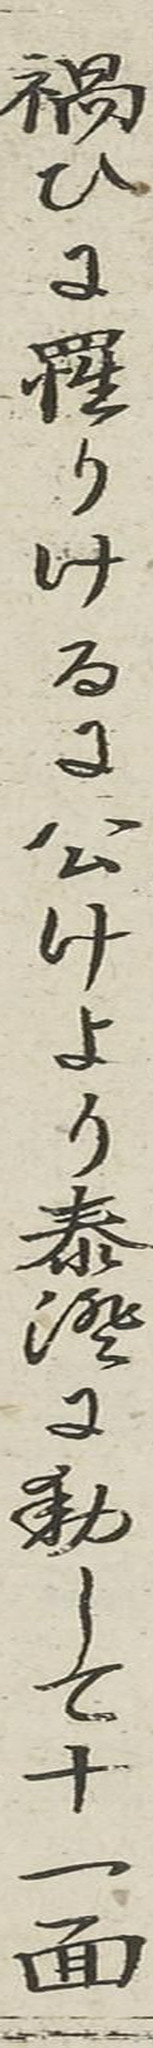禍ひに罹りけるに公けより泰澄に勅して十一面
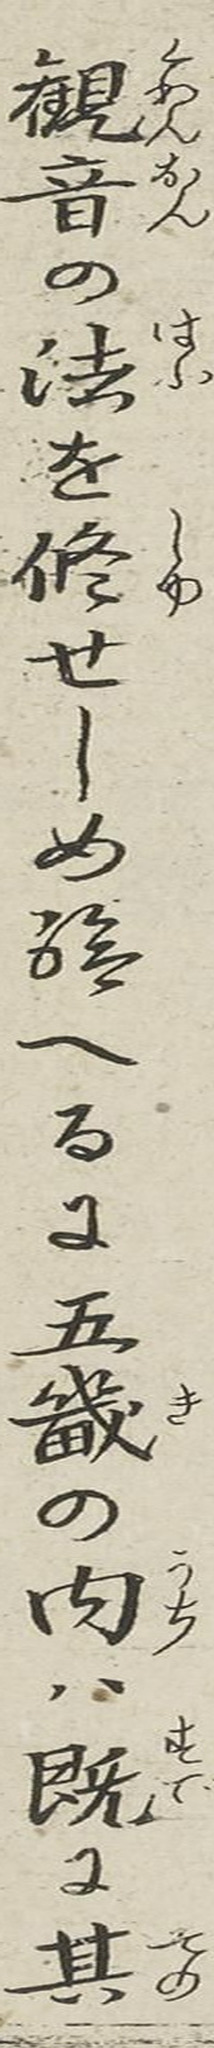観音の法を修せしめ給へるに五畿の内は既に其

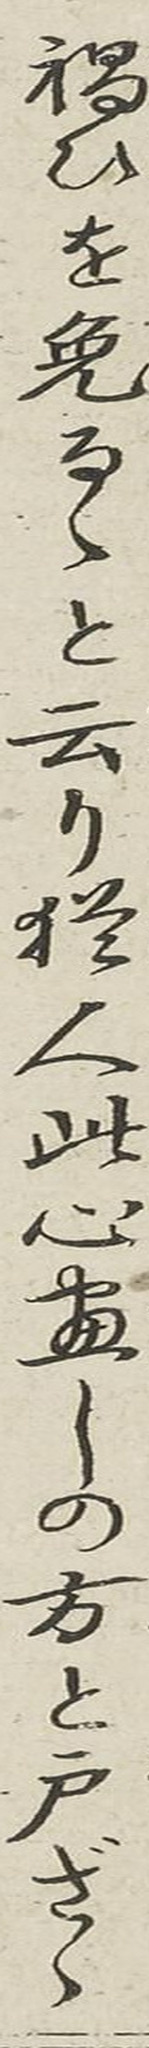禍ひを免るゝと云り猶人此心盡しの方と戸ざゝ
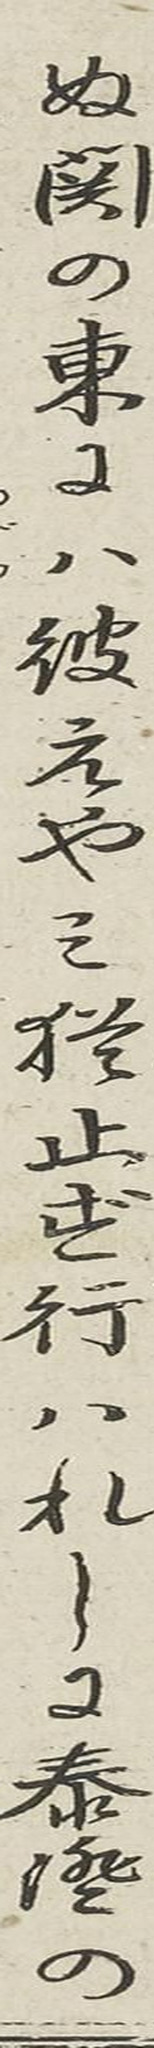ぬ関の東には彼えやみ猶止ず行はれしに泰澄の
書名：箱根温泉誌　全
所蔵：東京大学地震研究所図書室 Earthquake Research Institute Library, The University of Tokyo, JAPAN
